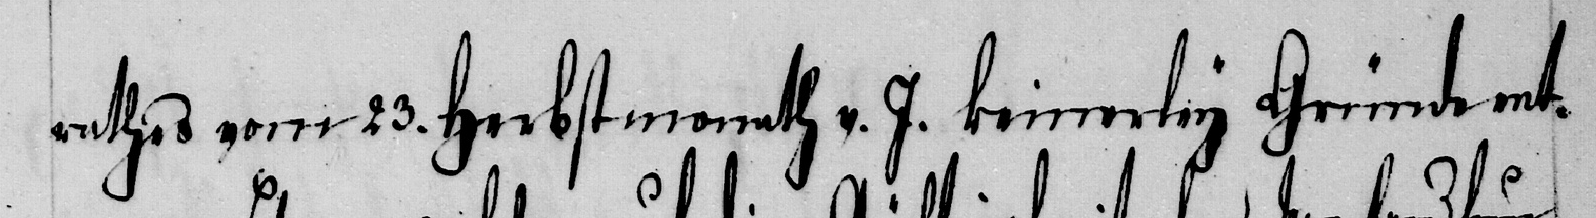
rathes vom 23. Herbstmonath v. J. keinerley Gründe ent¬
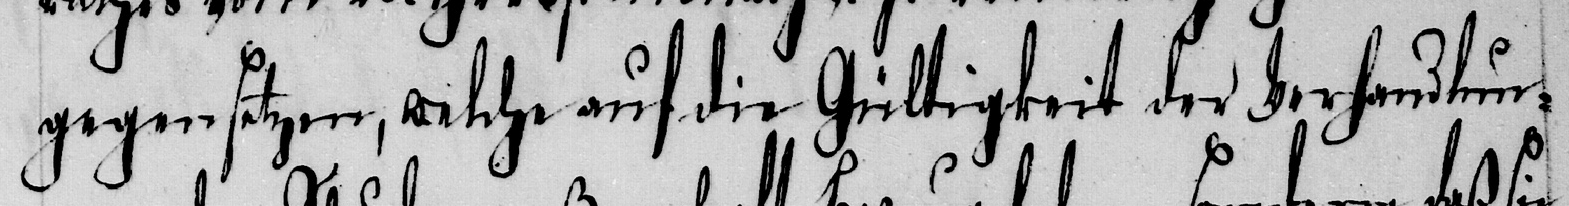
gegensetzten, welche auf die Gültigkeit der Verhandlun¬
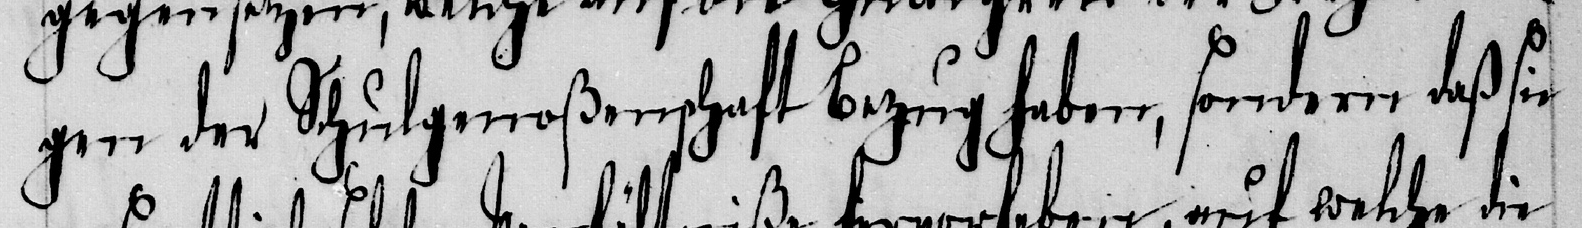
gen der Schulgenoßenschaft Bezug haben, sondern daß sie
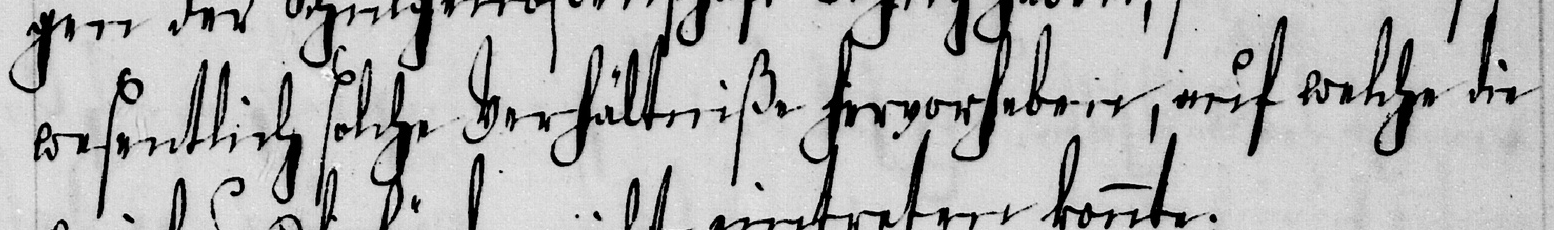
wesentlich solche Verhältniße hervorheben, auf welche die
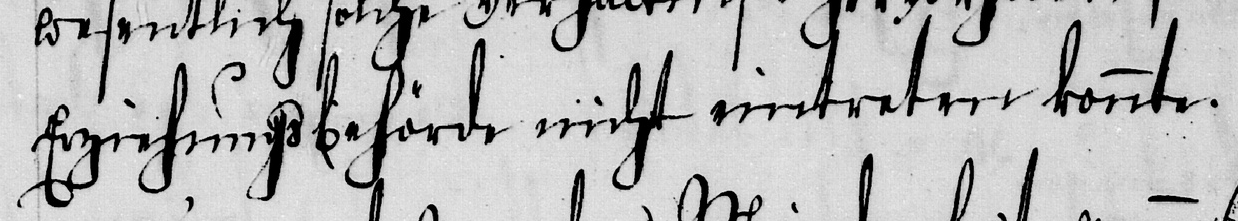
Erziehungsbeghörde nicht eintreten konnte.
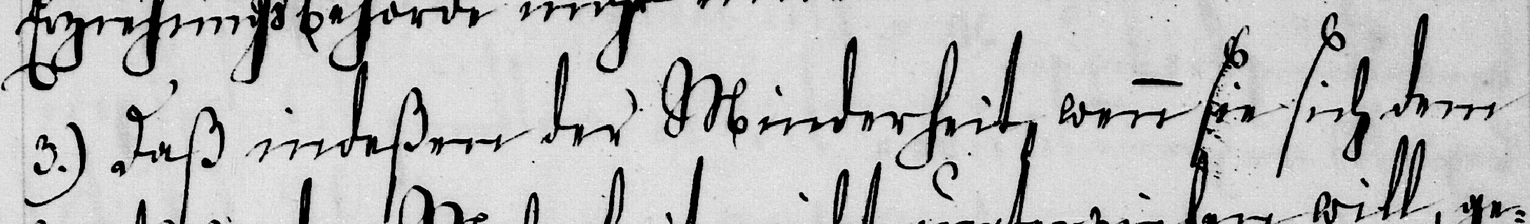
3.) Daß indeßen der Minderheit, wenn sie sich dem
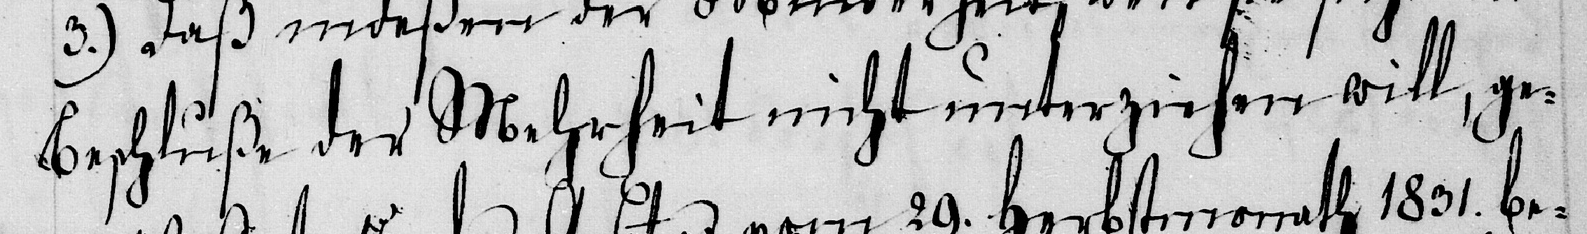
Beschluß der Mehrheit nicht unterziehen will, ge¬
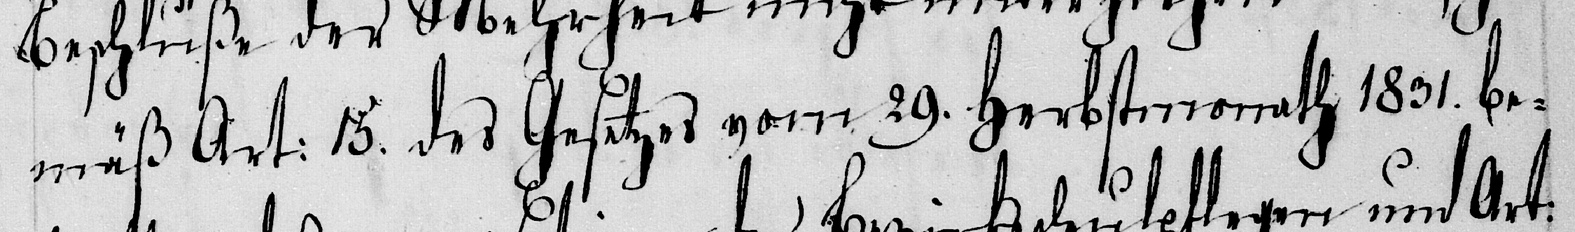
mäß Art: 15. des Gesetzes vom 29. Herbstmonat 1831. be¬
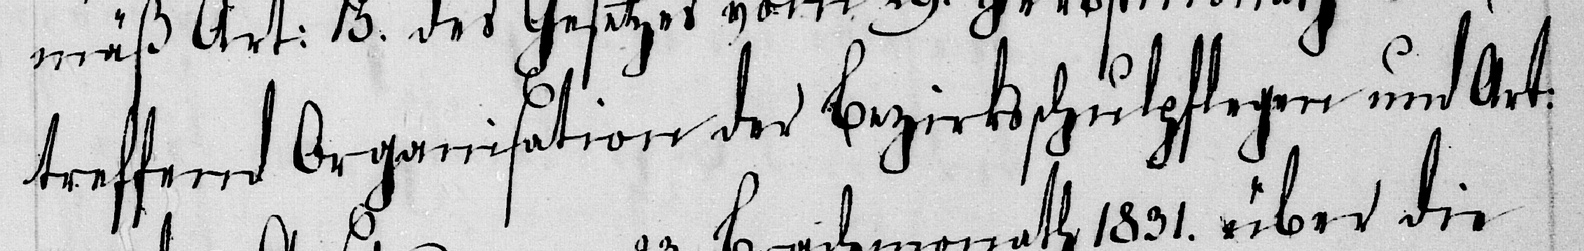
treffend Organisation der Bezirksschulpflegen und Art:
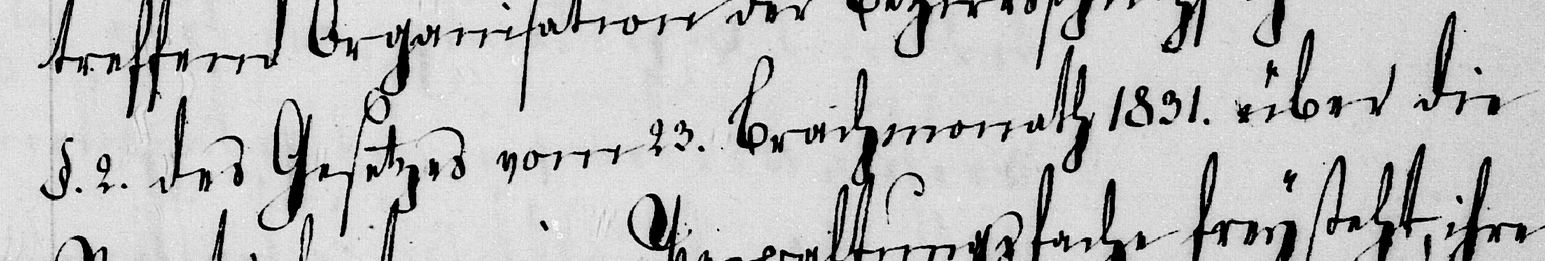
§. 2. des Gesetzes vom 23. Brachmonath 1831. über die
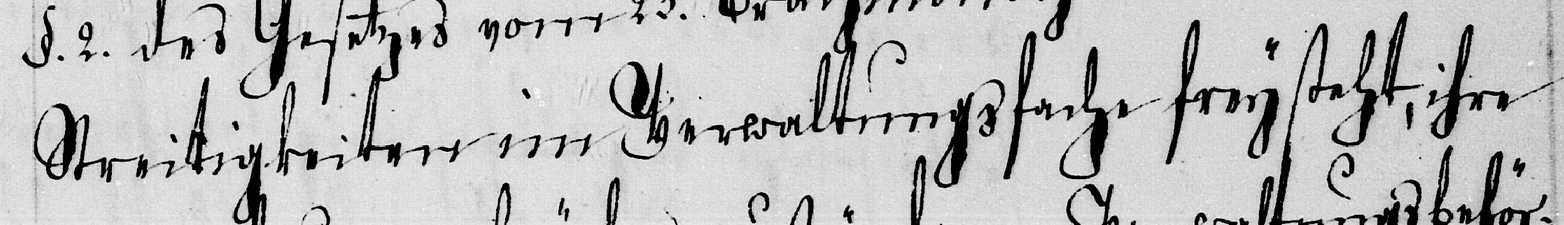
Streitigkeiten im Verwaltungsfache freysteht, ihre
